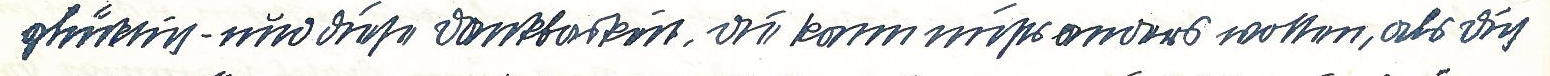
glücklich – und diese Dankbarkeit, die kann nichts anders wollen, als Dich
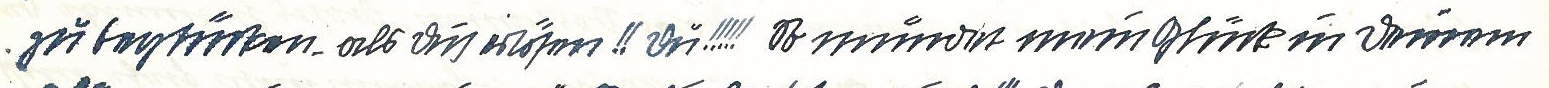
zu beglücken, als Dich erlösen!! Du!!!!! So mündet mein Glück in Deinem
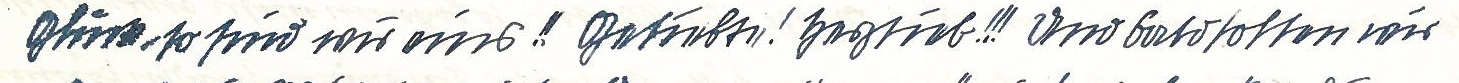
Glück, so sind wir eins!! Geliebte! Herzlieb!!! Und bald sollen wir
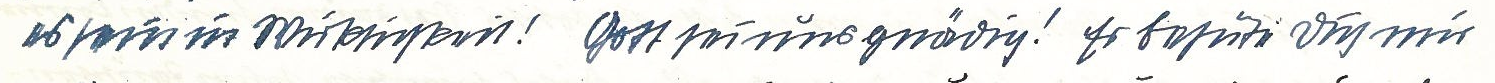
es sein in Wirklichkeit! Gott sei uns gnädig! Er behüte Dich mir
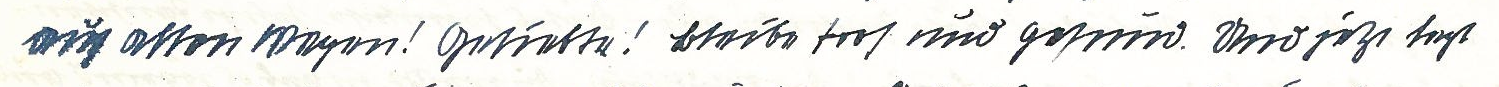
auf allen Wegen! Geliebte! Bleibe froh und gesund. Und jetzt legt
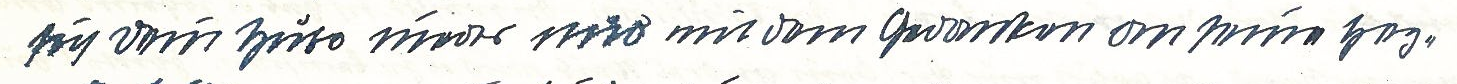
sich Dein Hubo nieder mit dem Gedanken an seine Herz¬
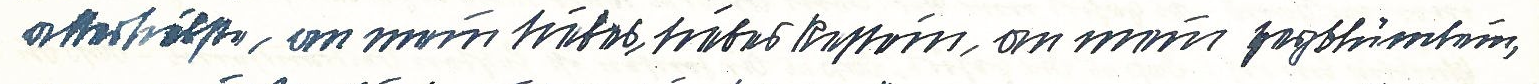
allerliebste, an mein liebes, liebes Rehlein, an mein Herzblümlein,
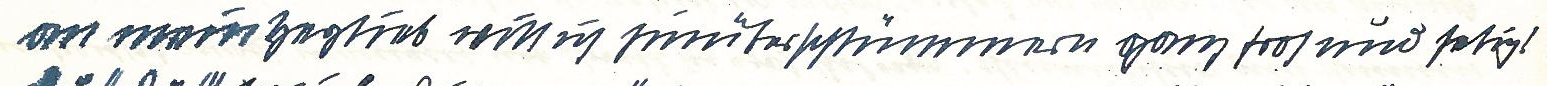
an mein Herzlieb will ich hinüberschlummern ganz froh und selig!
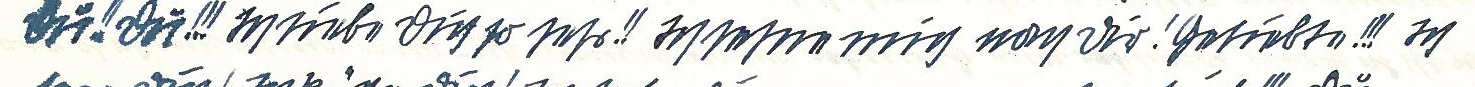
Du!! Du!!! Ich liebe Dich so sehr!! Ich sehne mich nach Dir! Geliebte!!! Ich
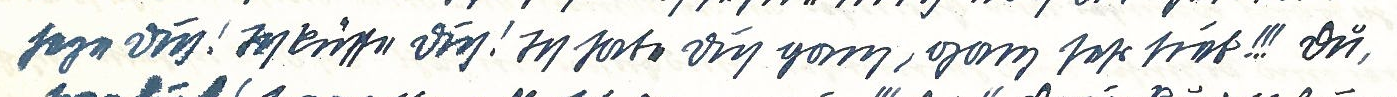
segn Dich! Ich küsse Dich! Ich habe Dich ganz, ganz sehr lieb!!! Du,
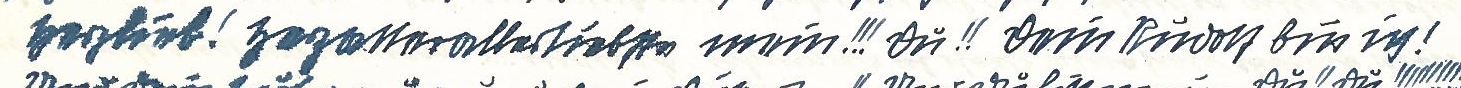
Herzlieb! Herzallerliebste mein!!! Du!! Dein bin ich!
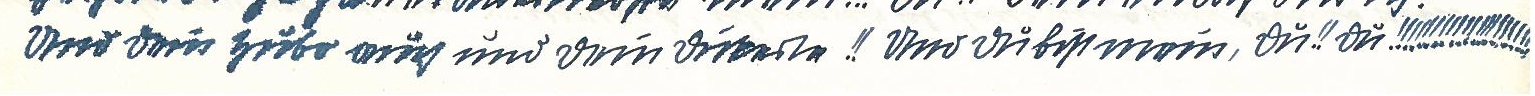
Und Dein Hubo auch und Dein Dickerle!! Und Du bist mein, Du!! Du!!!!!!!!!!!!!!!!!!!!
